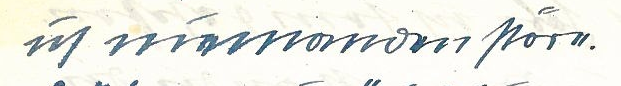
ich niemanden störe.
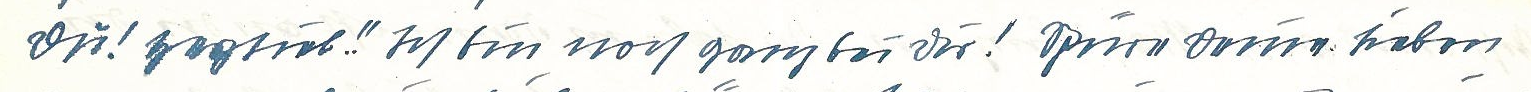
Du! Herzlieb!! ich bin noch ganz bei Dir! Spüre Deine lieben
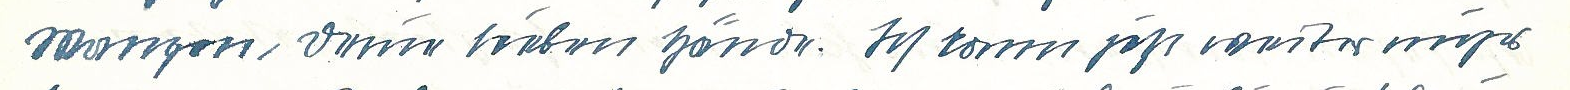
Wangen, Deine lieben Hände. Ich kann jetzt weiter nichts
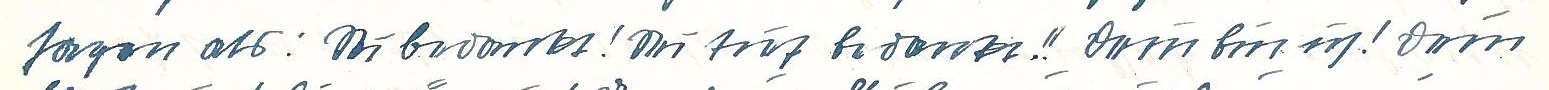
sagen als: Sei bedankt! Sei tief bedankt!! Dein bin ich! Dein
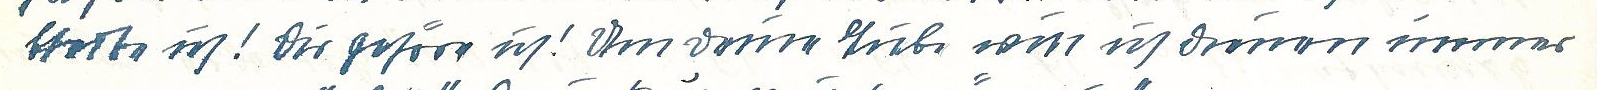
bleibe ich! Dir gehöre ich! Um Deine Liebe will ich dienen immer
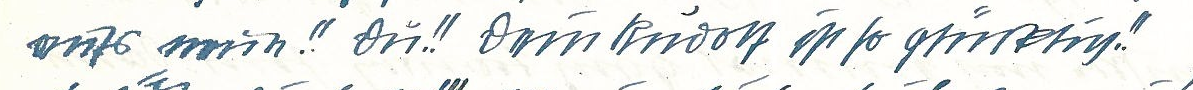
aufs neue!! Du!! Dein Rudolf ist so glücklich!!
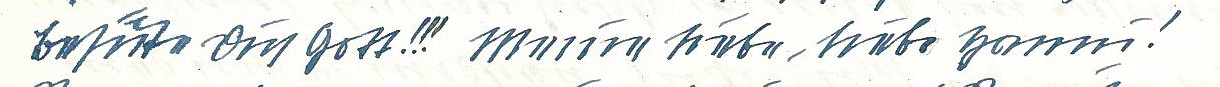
Behüte Dich Gott!!! Meine liebe, liebe!
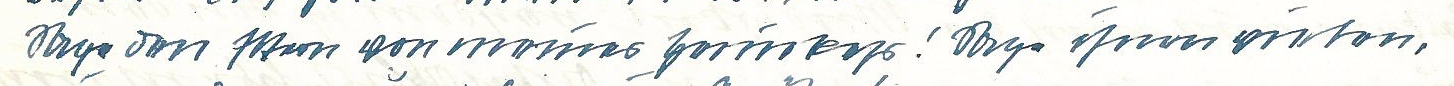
Sage den Eltern von meiner Heimkehr! Sage ihnen vielen,
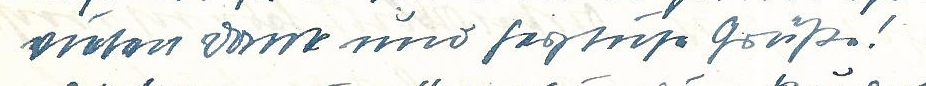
vielen Dank und herzliche Grüße!
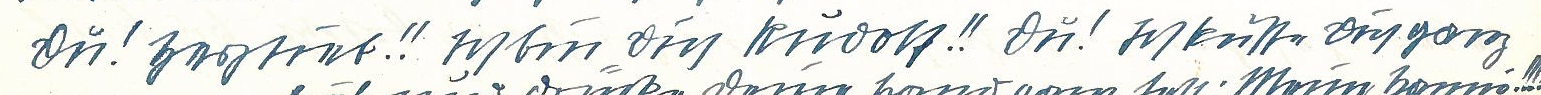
Du! Herzlieb!! Ich bin Dich Rudolf!! Du! ich küsse Dich ganz
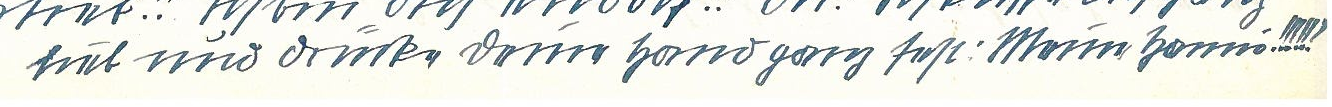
lieb und drücke Deine Hand ganz fest. Meine !!!!!!
